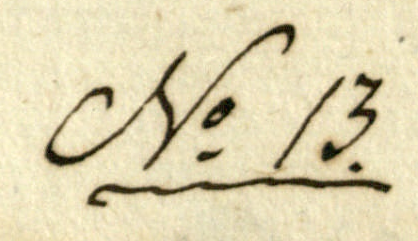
No 13.
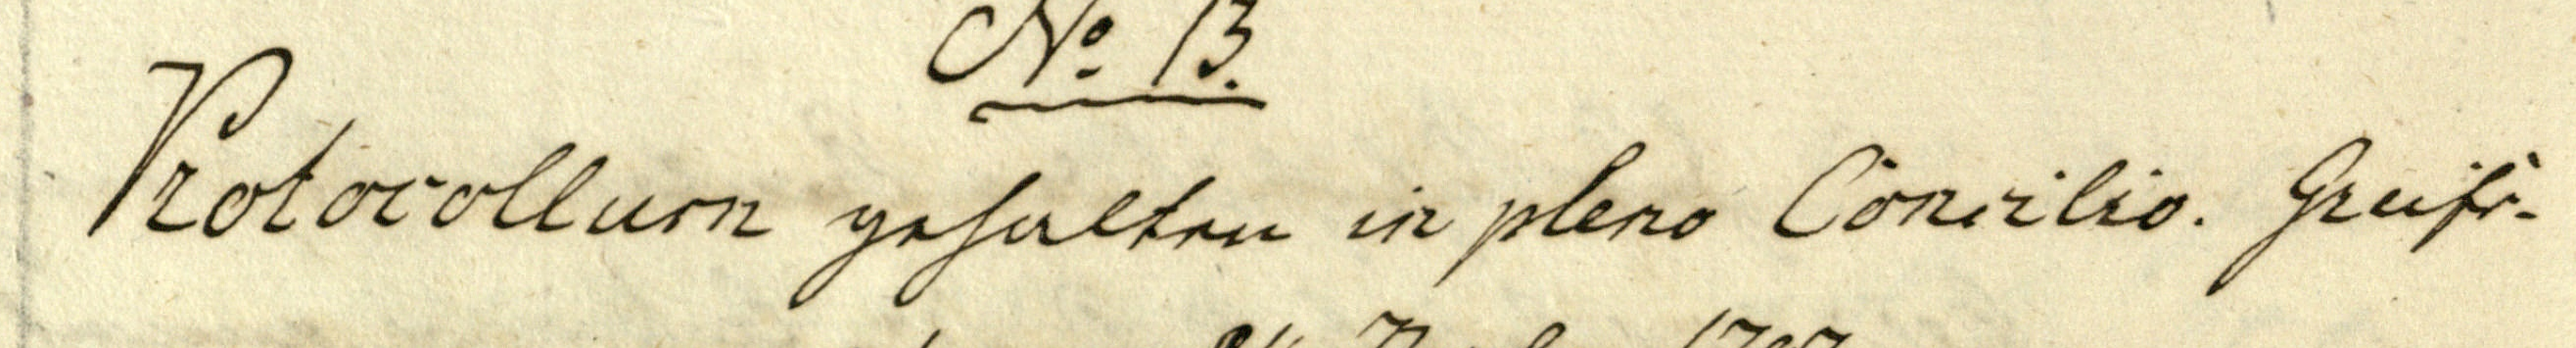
Protocollum gehalten in pleno Concilio. Geifs¬
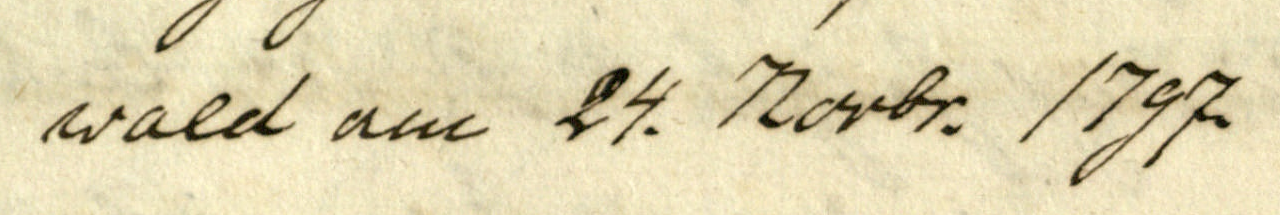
wald am 24. Novbr. 1797.
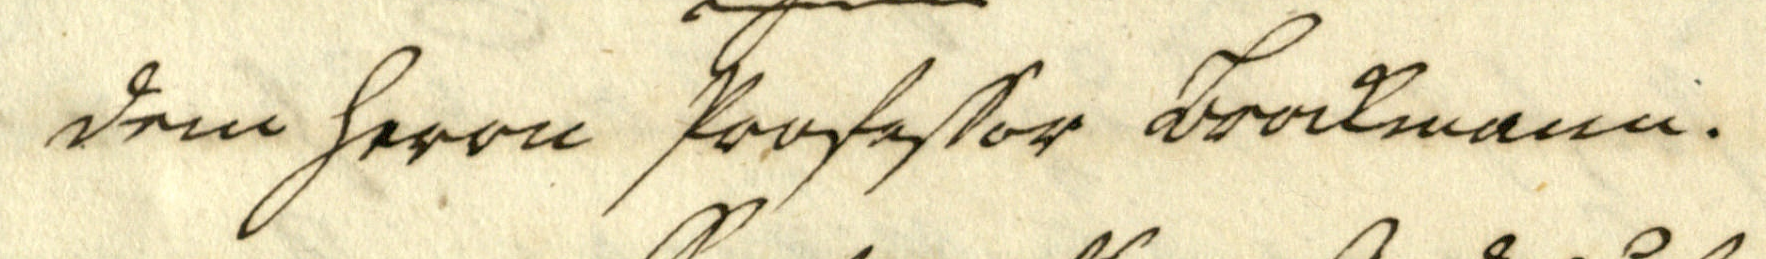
dem herrn Professor Brockmann.
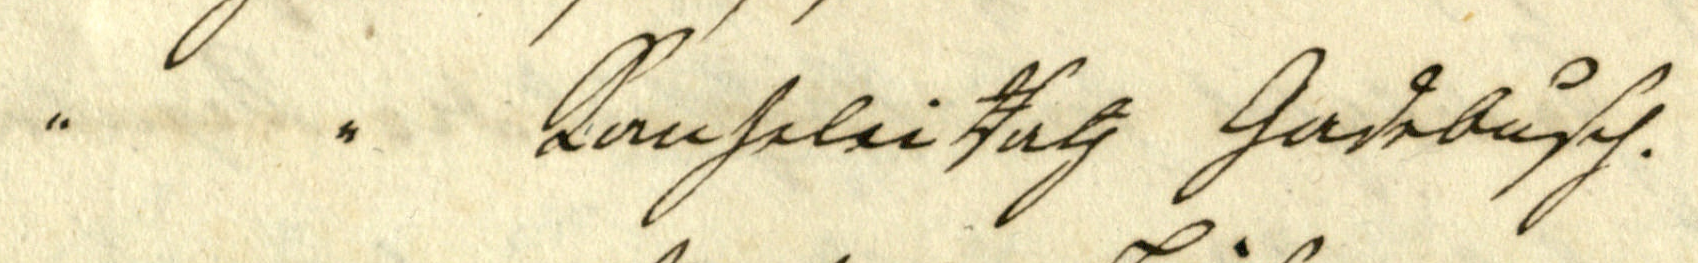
KanzeleiRath Gadebusch.
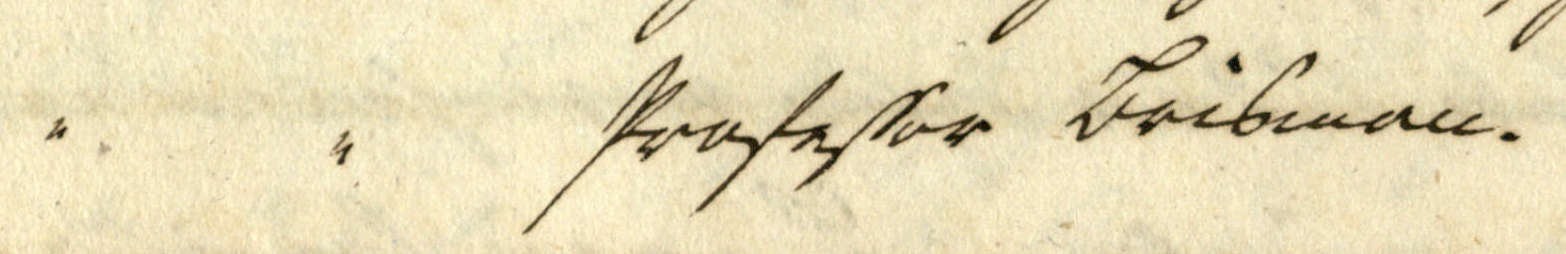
Professor Brisman.
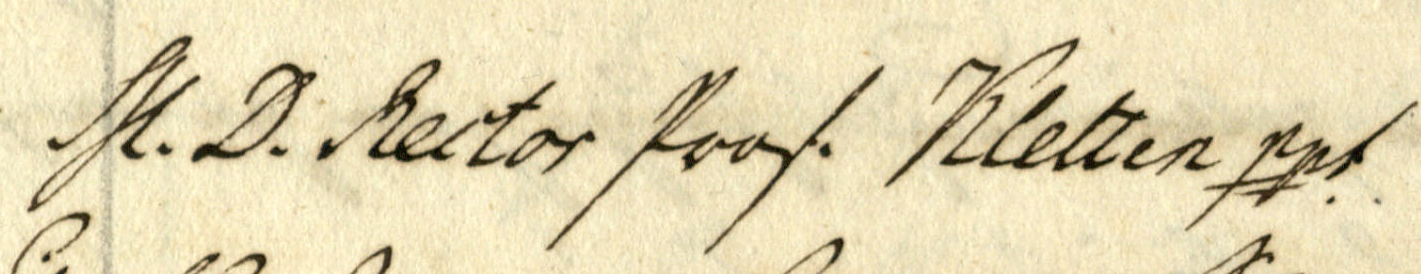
M. D. Rector Prof. Kletten ppt.
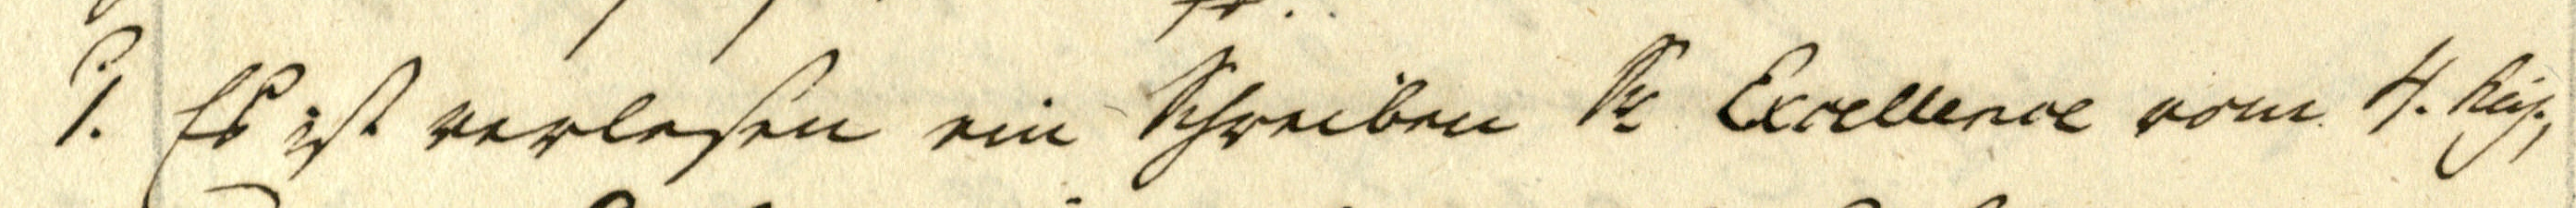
1. Es ist verlesen ein Schreiben Sr Excellence vom 4. huj.,
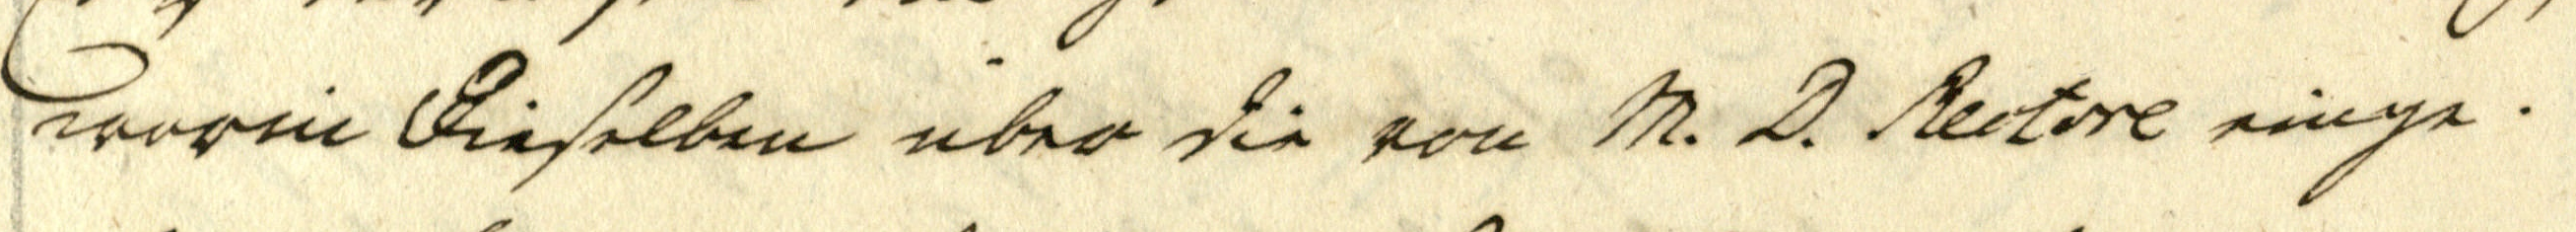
worin Dieselben über die von M. D. Rectore einge¬
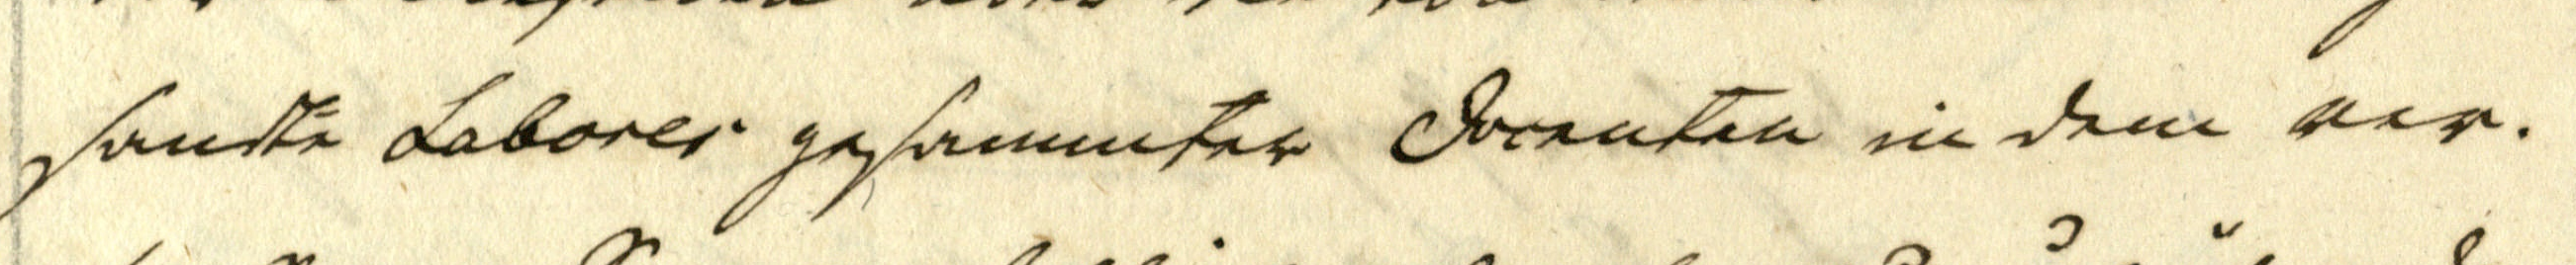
sandte Labores gesammter Docenten in dem ver¬
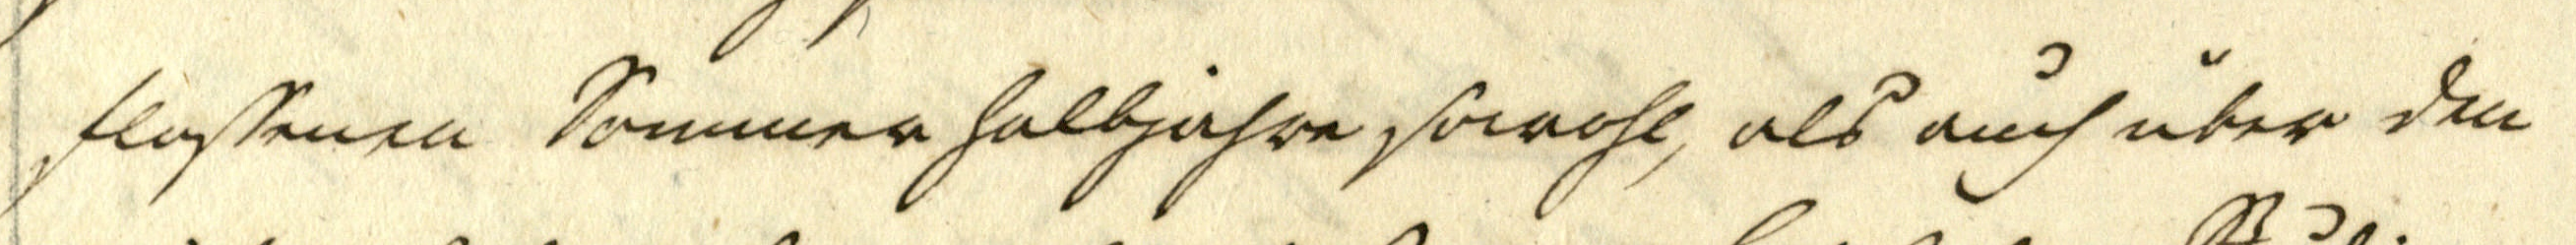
flossenen Sommer Halbjahre sowohl, als auch über den
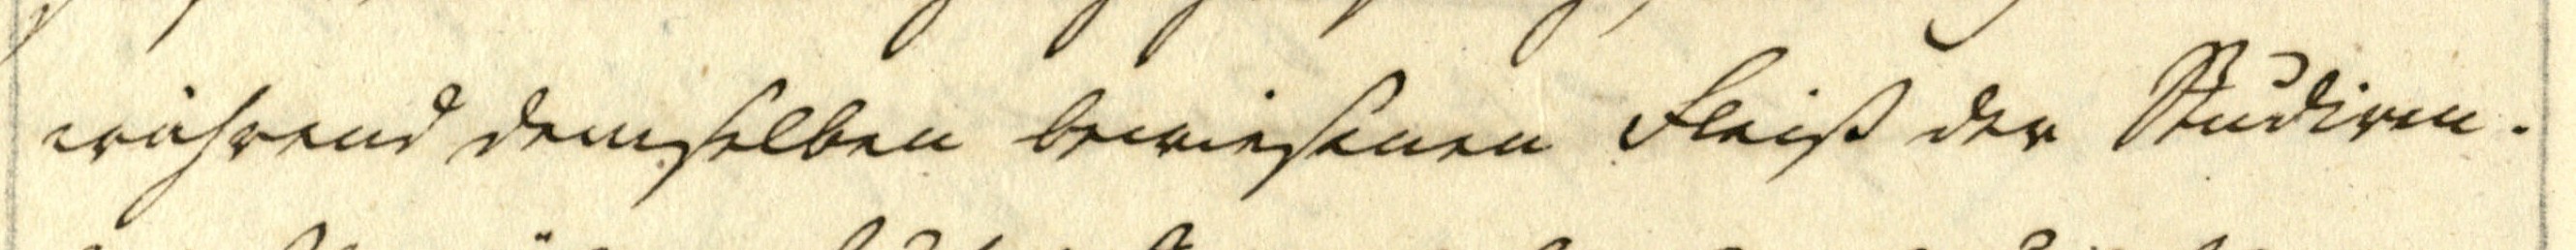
während demselben bewiesenen Fleiß der Studiren¬
